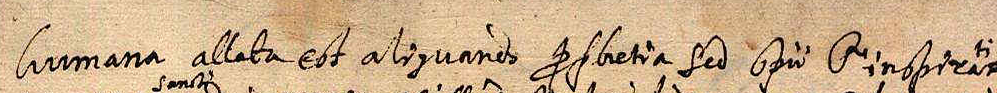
humana allata est aliquando ꝓphetia sed spū sto inspirati
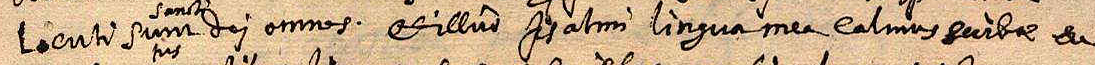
locuti sunt sancti dej omnes. & illud psalmi lingua mea calmus scribæ &c.
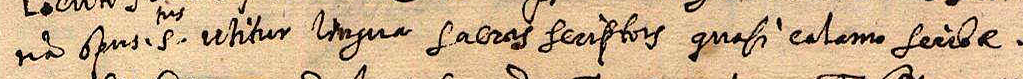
nā spus. s.tus utitur lingua sacraꝝ scriptoꝝ quasi calamo scribæ.
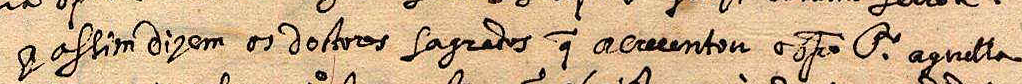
E assim dizem os doctores sagrados q̄ acrecentou o sp̄o s.to aquella
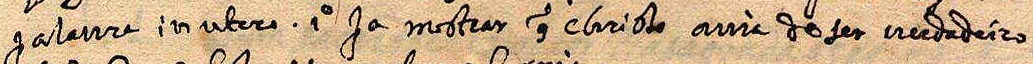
palaura in utero. 1o pa mostrar q̄ christo auia de ser uerdadeiro
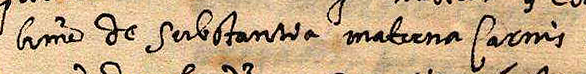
hmē de substantia materna Carnis.
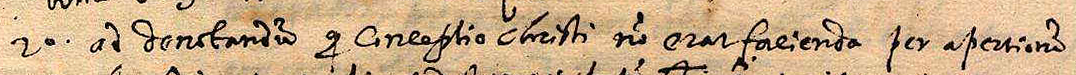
2o. ad denotandū ꝙ conceptio christi nō erat facienda per apertionē
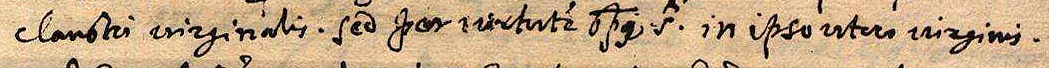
claustri virginalis. sed per uirtutē sp̄ꝯ s.ti in ipso utero uirginis.
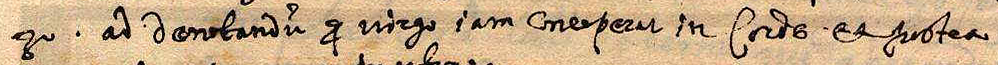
3o. ad denotandū ꝙ uirgo iam conceperat in Corde. & postea
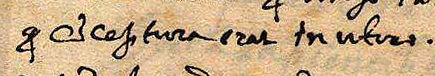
ꝙ cōceptura erat in utero.
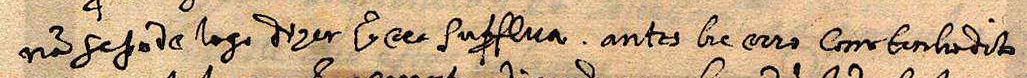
naõ se pode logo dizer q̄ era suꝑflua. antes he erro como tenho dito
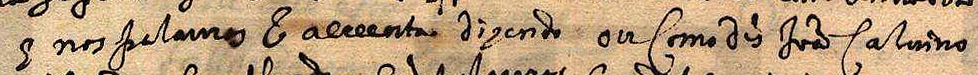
E nas palauras q̄ acrecenta dizendo ou Como dis Joaõ Caluino
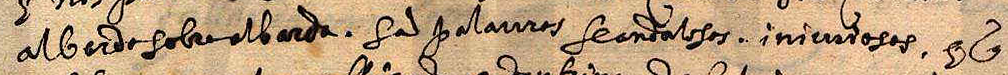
albarda sobre albarda. saõ palauras scandalosas. iniuriosas, E q̄
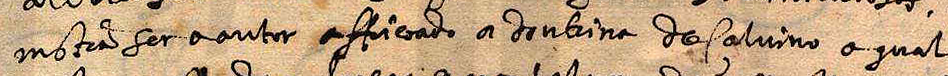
mostraõ ser o autor affeiçoado a doutrina de Caluino o qual
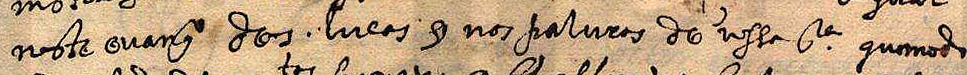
neste euango de s. lucas e nas paluras de nossa s.ra quo modo
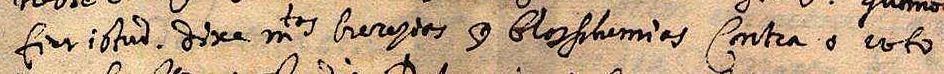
fiat istud. dixe mtas herezias e blasphemias Contra o uoto
